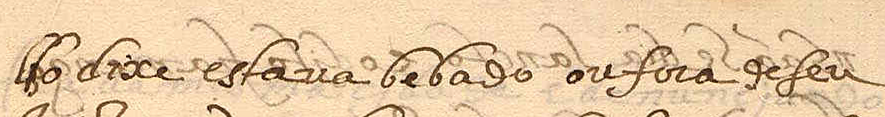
lho dixe estaua bebado ou fora de seu
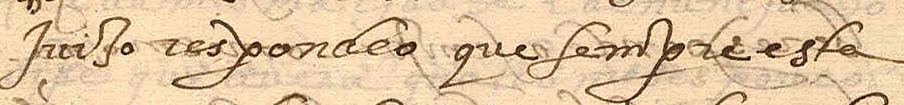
Juizo respondeo que sempre esta
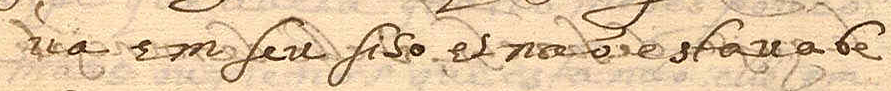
ua Em seu siso E naõ estaua be
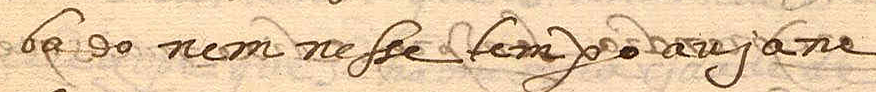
bado nem nesse tempo auja ne
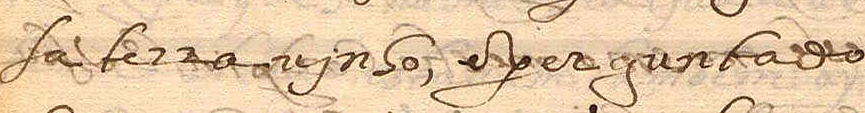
sa terra uinho, e perguntado
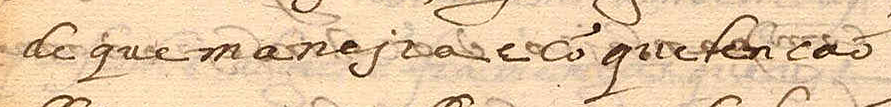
de que manejra E cō que tençaõ
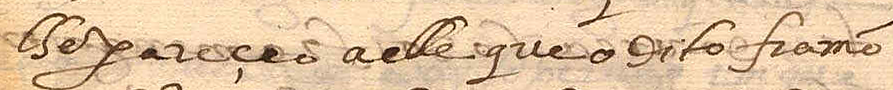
lhe pareceo a elle que o dito framē
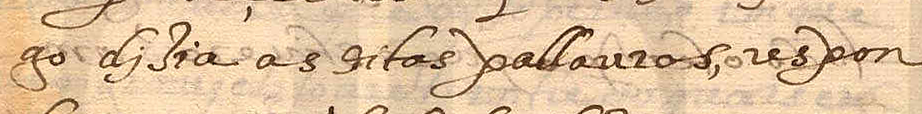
go dizia as ditas pallauras, respon
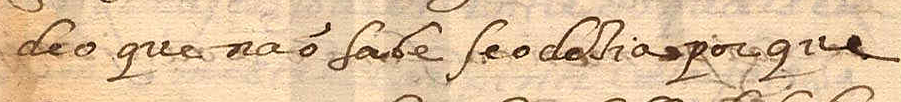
deo que naõ sabe se o dezia porque
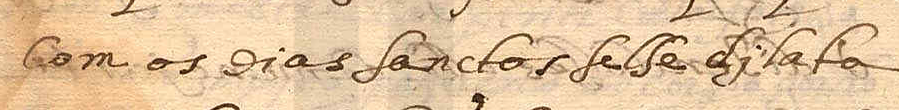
com os dias sanctos se lhe djlata
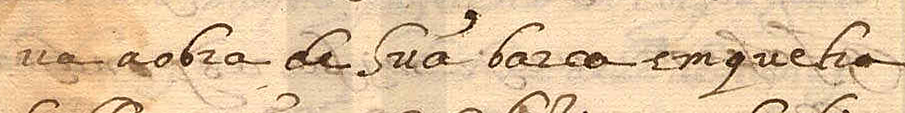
ua a obra de huā barca Em que tra
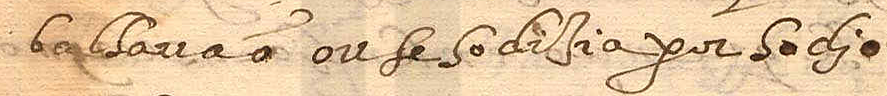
balhauaõ ou se ho dizia por hodjo
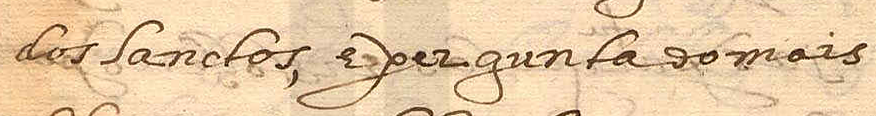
dos Sanctos, E perguntado mais
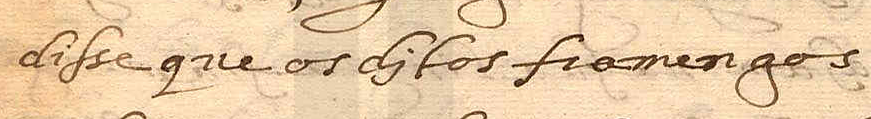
disse que os djtos framengos
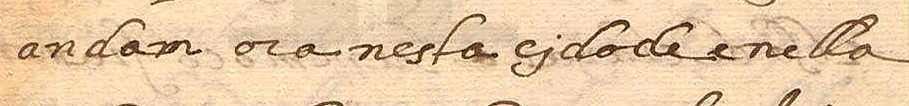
andam ora nesta cjdade e nella
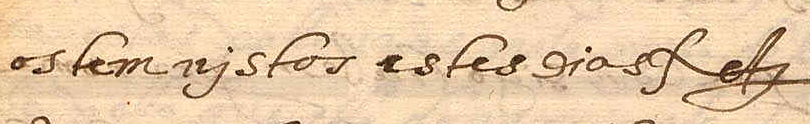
os tem ujstos estes dias
